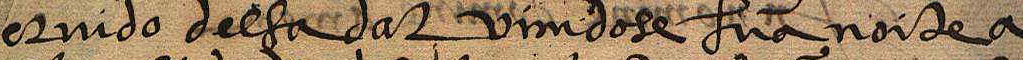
eruido de lha dar vimdose huā noite a
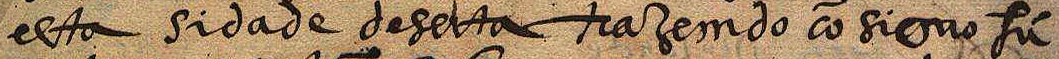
esta sidade de seita trazemdo c̄osiguo hū
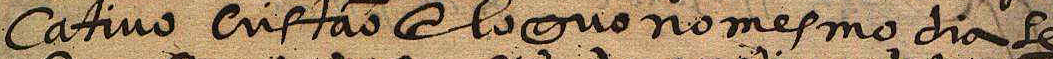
Catiuo cristão e loguo no mesmo dia se
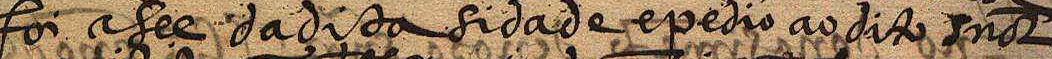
foi a see da dita sidade e pedio ao dito snōr
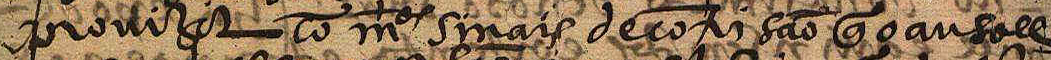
prouizor c̄o mtos sinais de c̄otrisaõ q̄ o ausoll
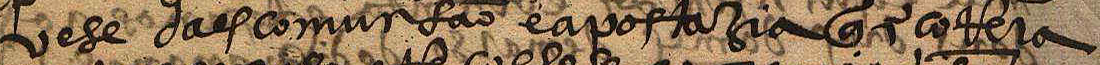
vese da escumunhaõ e apostazia q̄ ēcoRera
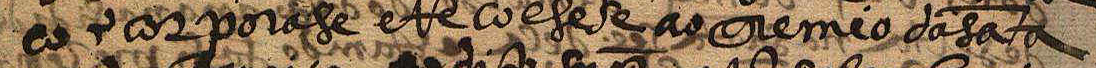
e o ēcorporase e Recolhese ao gremio da sāta
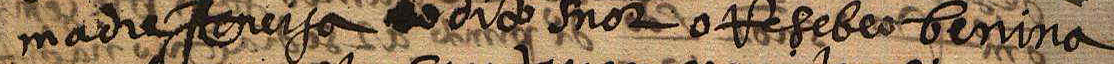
madre Jgreija e o dito senōr o Resebeo benina
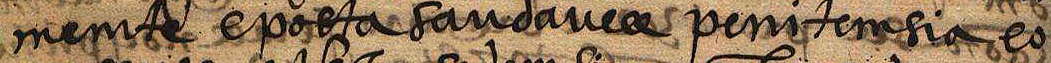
memte e posta saudauell penitemsia e o
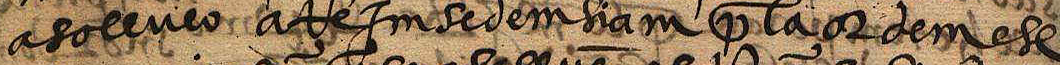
asollueo a ReJmsedemsiam p̄la ordem e se
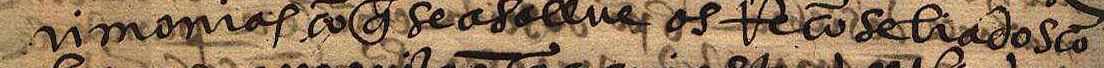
rimonias c̄o q̄ se asolluē os Rec̄oseliados cō
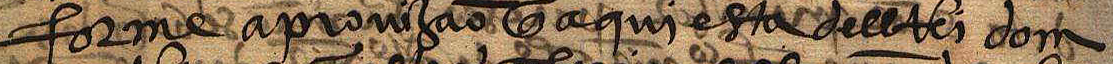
forme a prouizaõ q̄ aquj esta dell Rei dom
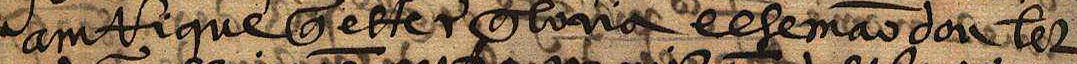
amRique q̄ este ē gloria e lhe mãodou ler
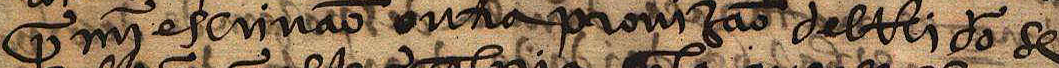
p̄o mj̄ escriuão outra prouizão del Rei dō se
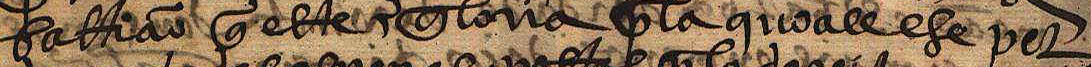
bastião q̄ este ē gloria p̄la quoall lhe per
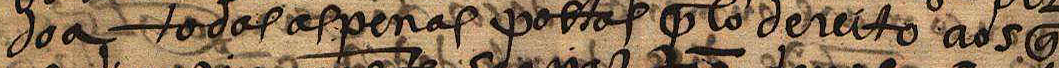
doa todas as penas postas p̄lo dereito aos q̄
